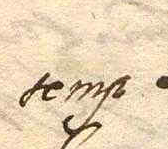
temp
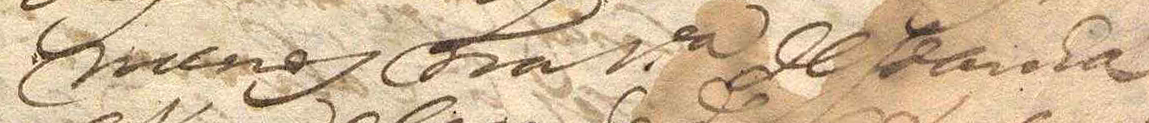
menos na v.a de Jdanha
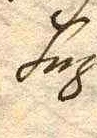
lug
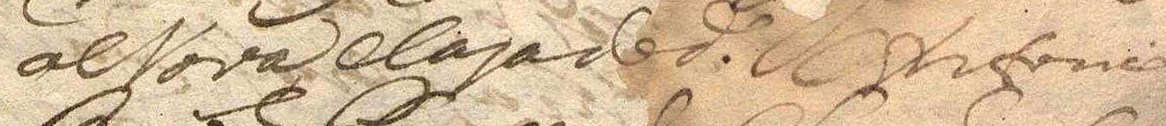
a Nova, e Caza do d.o Antonio
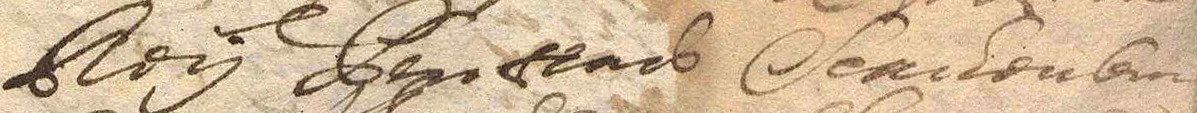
Rois̄ Penteado Se achou com
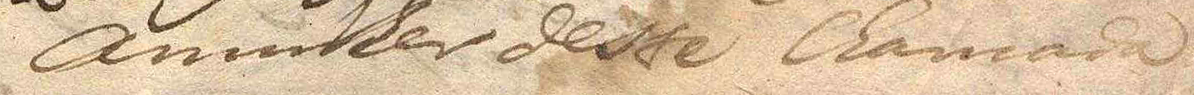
a mulher deste chamada
